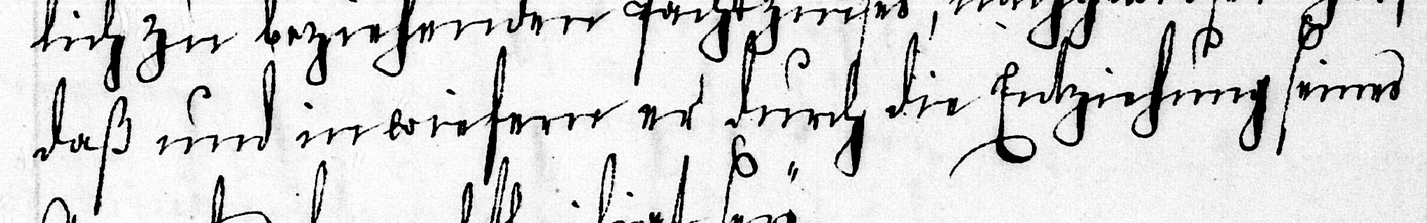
daß und in wiefern er durch die Entziehung seines
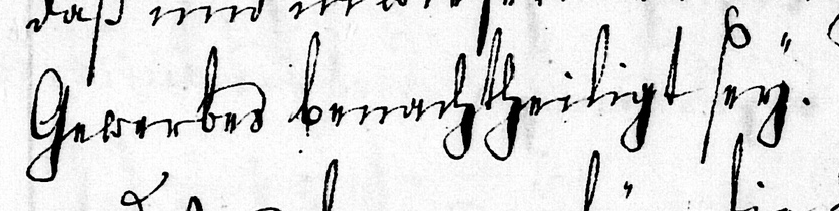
Gewerbes benachtheiligt sey.
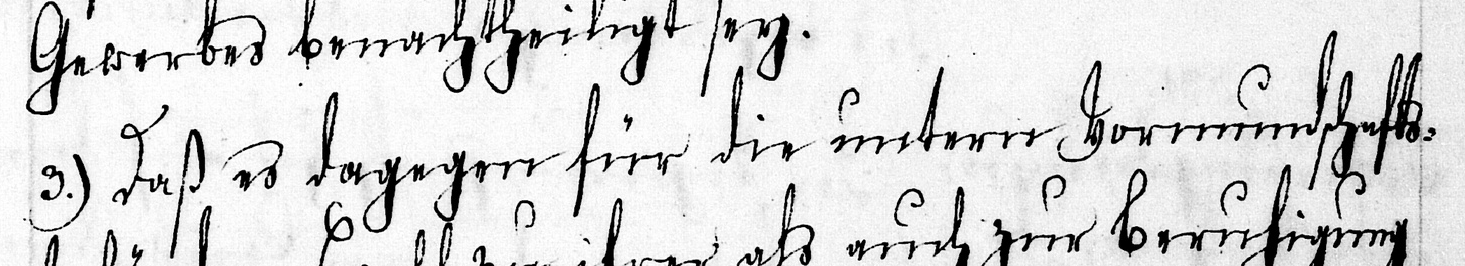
3.) Daß es dagegen für die untern Vormundschafts¬
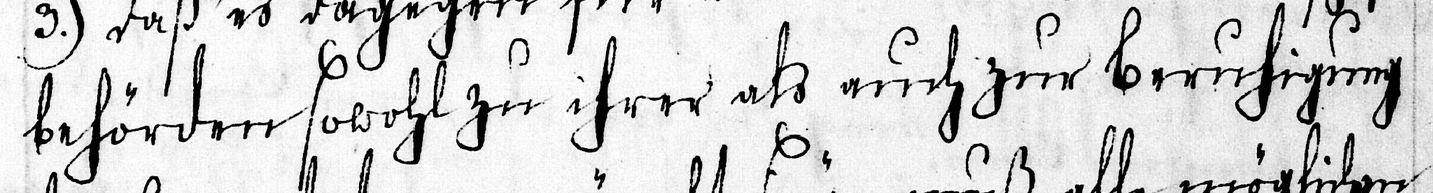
behörden sowohl zu ihrer als auch zur Beruhigung
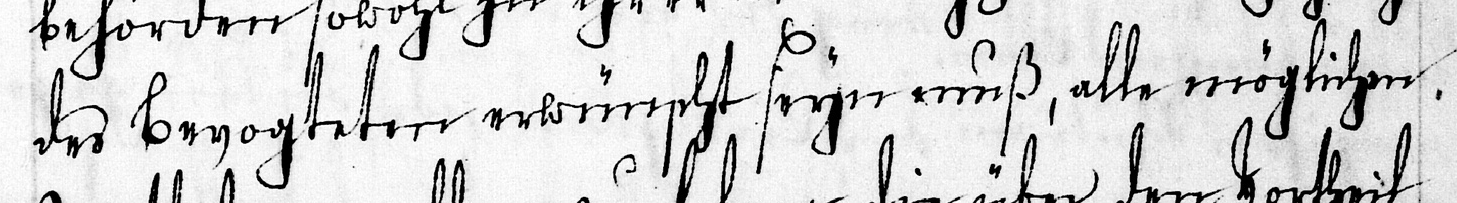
des Bevogteten erwünscht seyn muß, alle möglichen
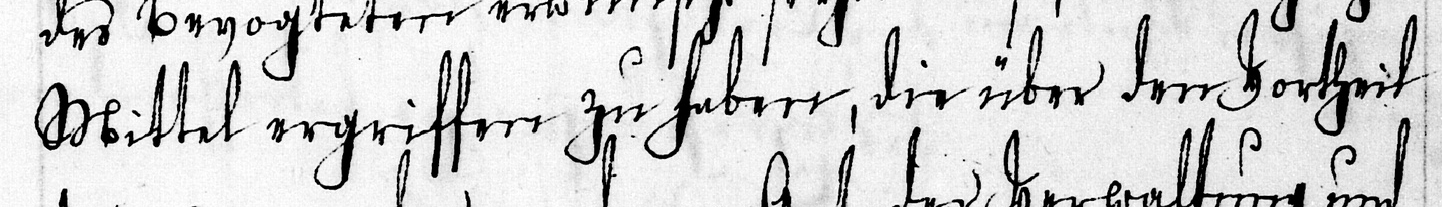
Mittel ergriffen zu haben, die über den Vortheil
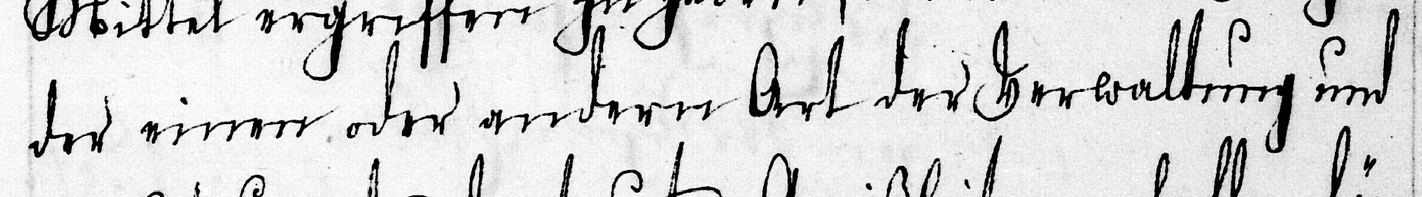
der einen oder andern Art der Verwaltung und
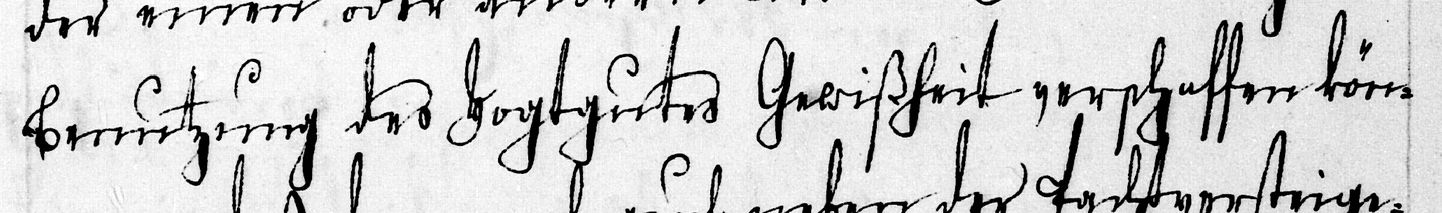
Benutzung des Vogtgutes Gewißheit verschaffen kön¬
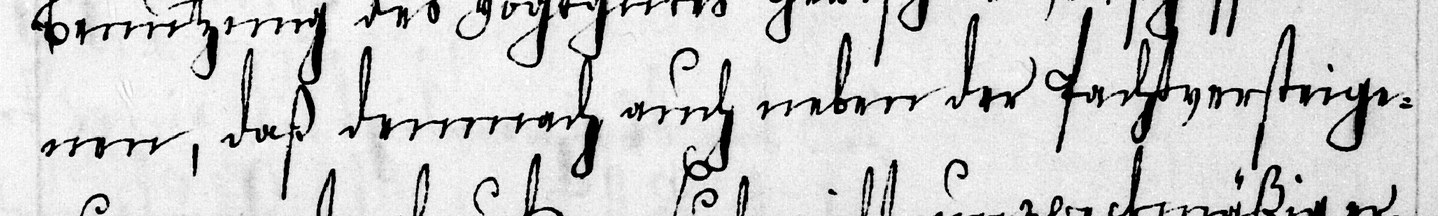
nen, daß demnach auch neben der Pachtversteige¬
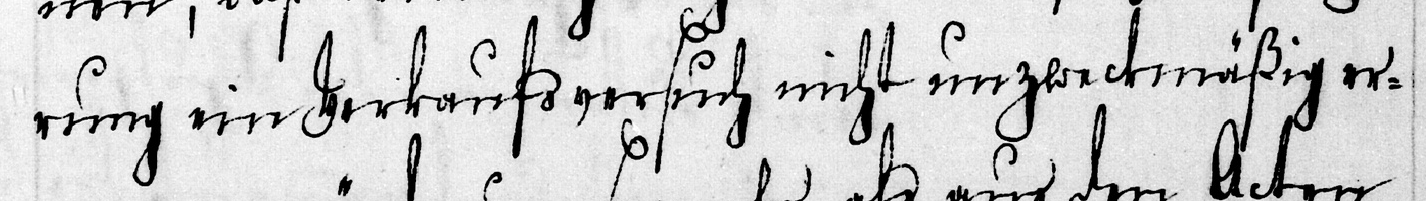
rung ein Verkaufsversuch nicht unzweckmäßig er¬
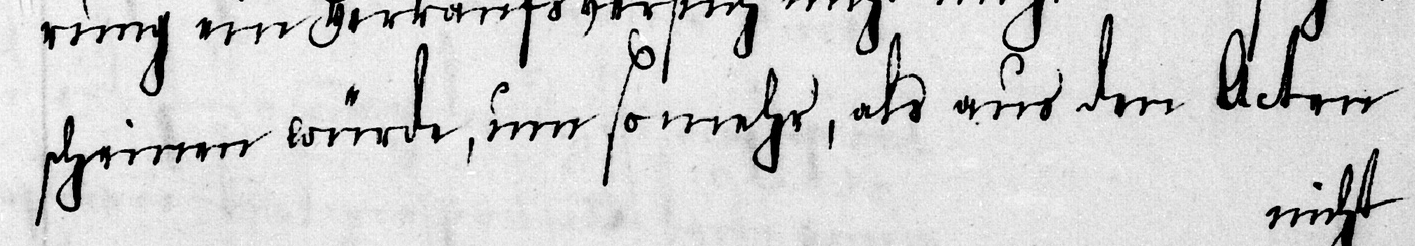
scheinen würde, um so mehr, als aus den Acten
